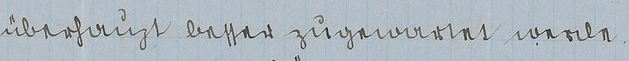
überhaupt besser zugewartet werde.
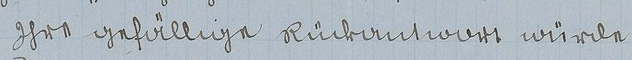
Ihre gefällige Rückantwort würde
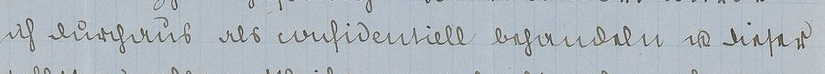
ich durchaus als confidentiell behandeln & dieser
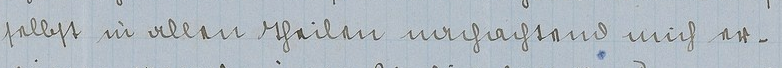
selbst in vollen Theilen nachachtend mich er-
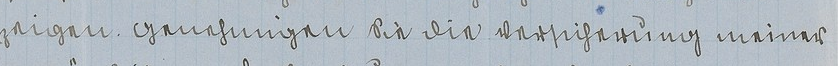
zeigen. Genehmigen Sie die Versicherung meiner
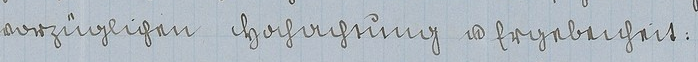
vorzüglichen Hochachtung & Ergebenheit:
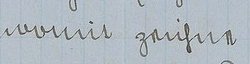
womit zeichne
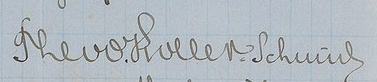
Theod. Koller-Schmid
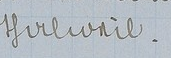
Thalweil.
